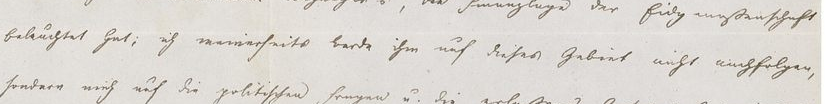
beleuchtet hat; ich meinerseits werde ihm auf dieses Gebiet nicht nachfolgen,
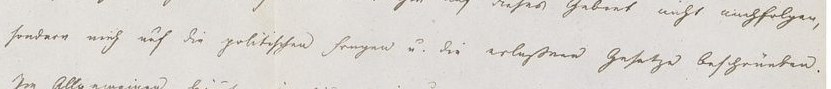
sondern mich auf die politischen Fragen u. die erlaßnen Gesetze beschränken.
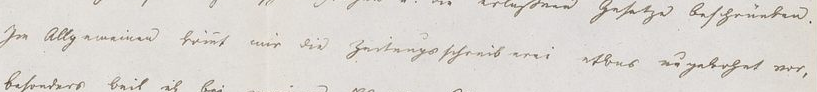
Im Allgemeinen kömmt mir die Zeitungsschreiberei etwas ungewohnt vor,
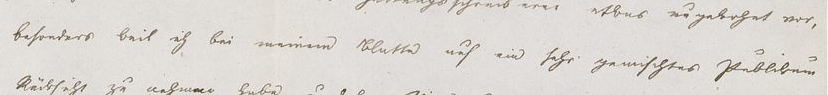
besonders weil ich bei meinem Blatte auf ein sehr gemischtes Publikum
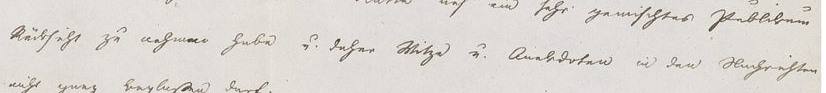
Rücksicht zu nehmen habe u. daher Witze u. Anekdoten in den Nachrichten
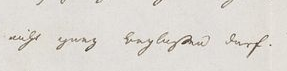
nicht ganz weglassen darf.
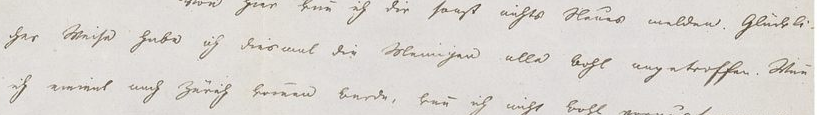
cher Weise habe ich diesmal die Meinigen alle wohl angetroffen. Wann
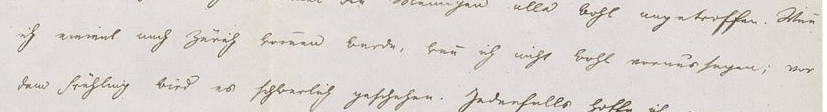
ich einmal nach Zürich kommen werde, kann ich nicht wohl voraussagen; vor
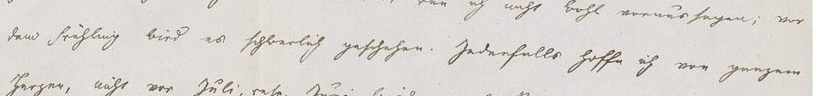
dem Frühling wird es sicherlich geschehen. Jedenfalls hoffe ich von ganzem
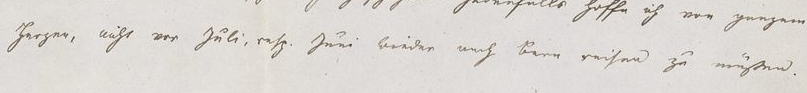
Herzen, nicht vor Juli, resp. Juni wieder nach Bern reisen zu müssen.
